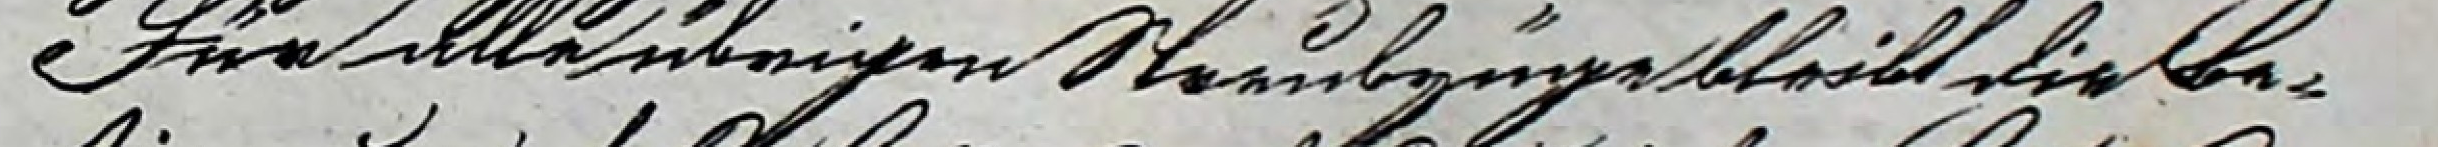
Für alle übrigen Streubzüge bleibt die Be„
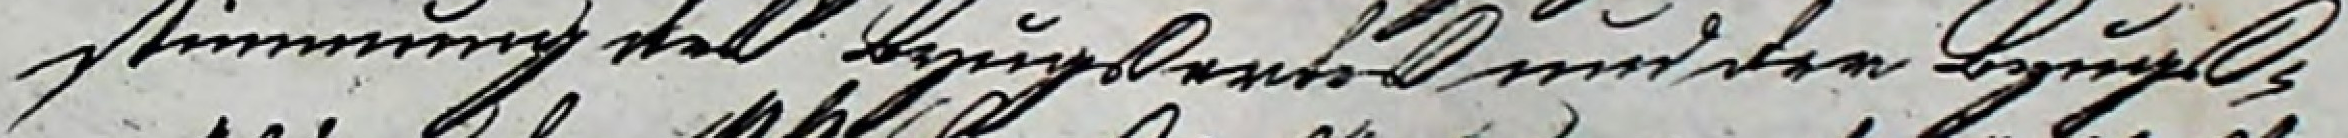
stimmung des Bezugsertes und der Bezugs„
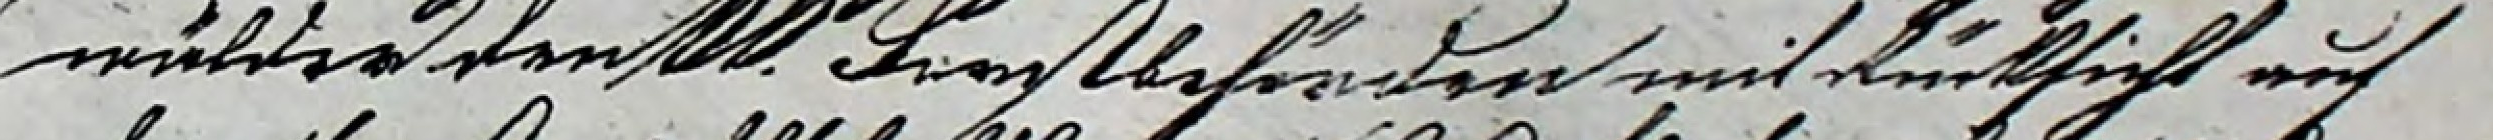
wälder den kk. Forstbehörden mit Rücksicht auf
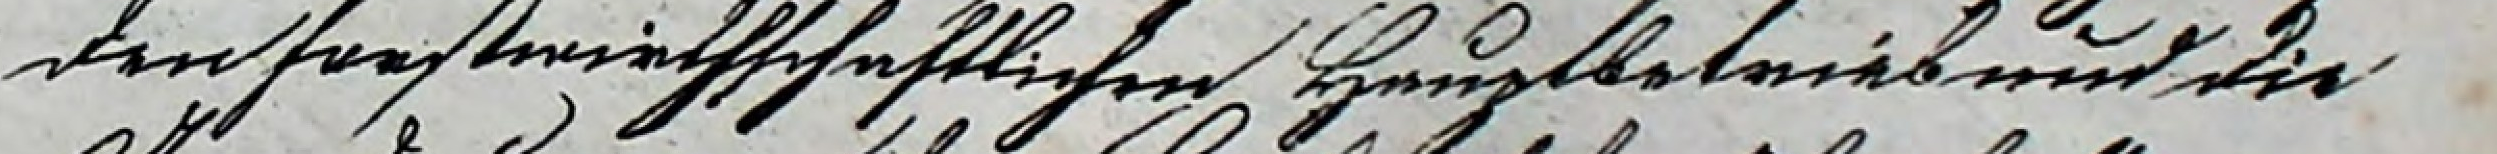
den Forstwirthschaftlichen Hauptbetrieb und die
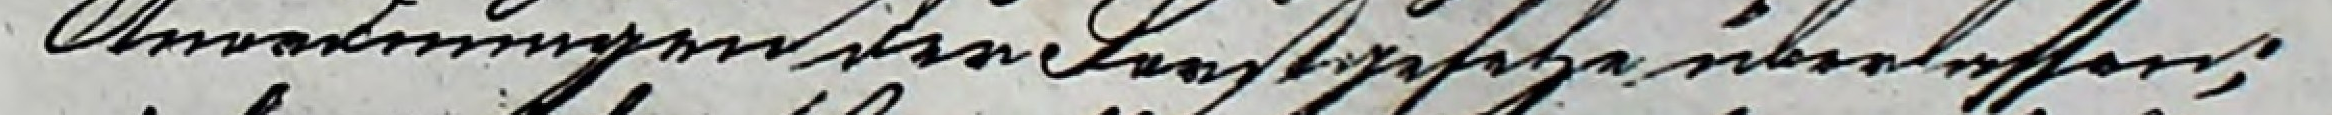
Anordnungen der Forstgesetze überlassen,
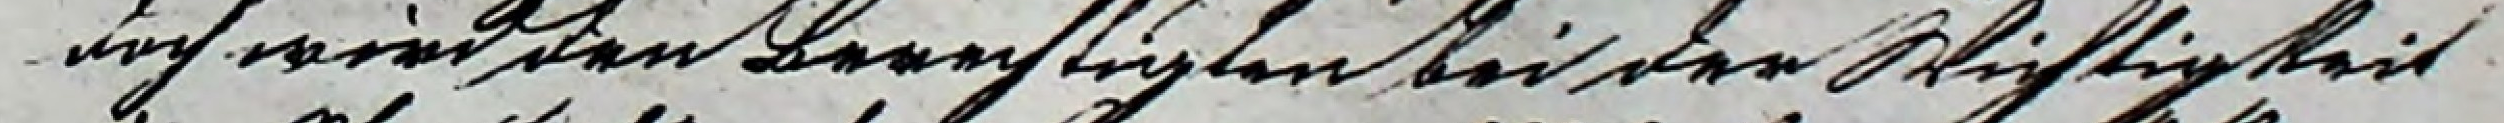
doch wird den Berechtigten bei der Wichtigkeit
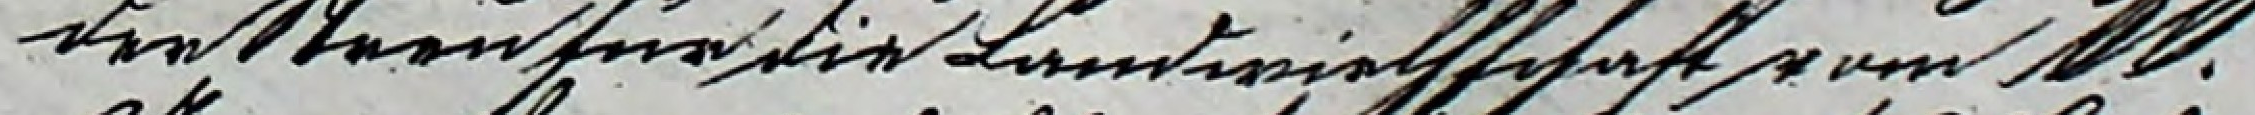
der Streu für die Landwirthschaft vom kk.
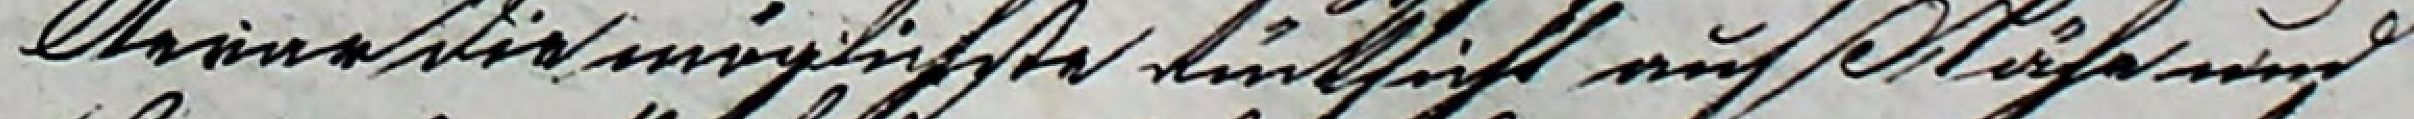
Aerar die möglichste Rücksicht auf Nähe und
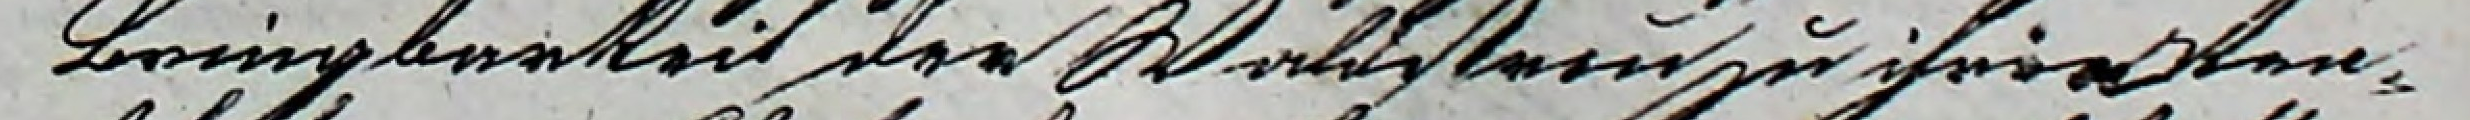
Brinzbarkeit der Waldstreu zu ihrer Rea„
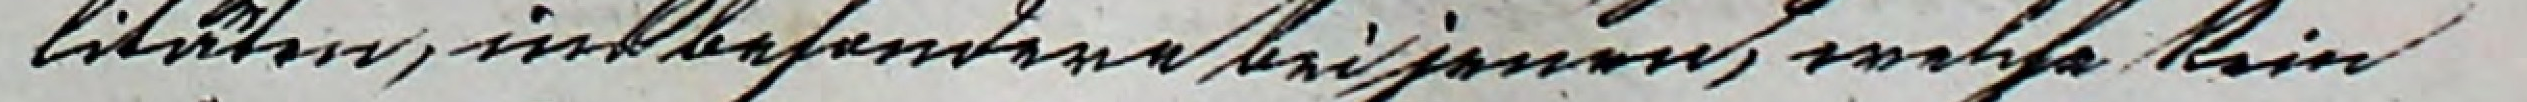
litäten, insbesondere bei jenen, welche kein
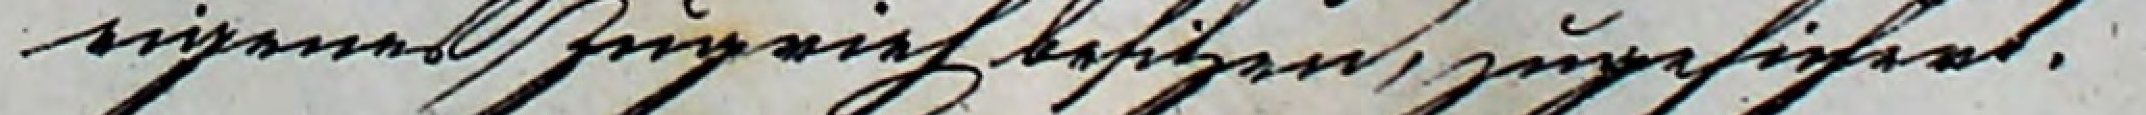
eigenes Zugriechbesitzen, zugesichert.
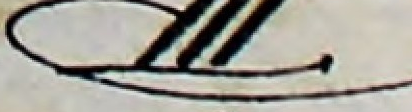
III
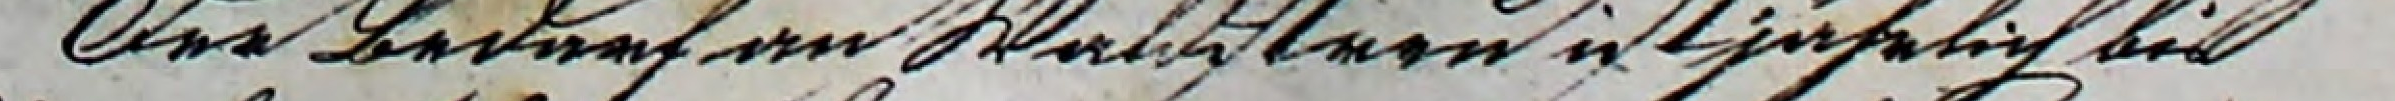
Der Bedarf an Waldstreu ist jährlich bis
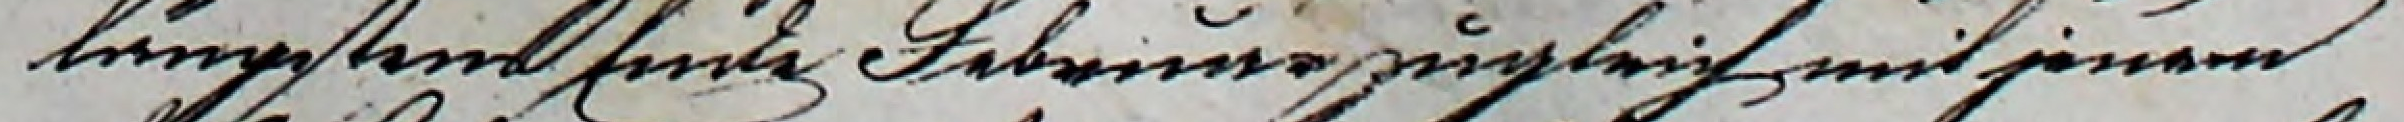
längstens Emde Februar zugleich mit jenem
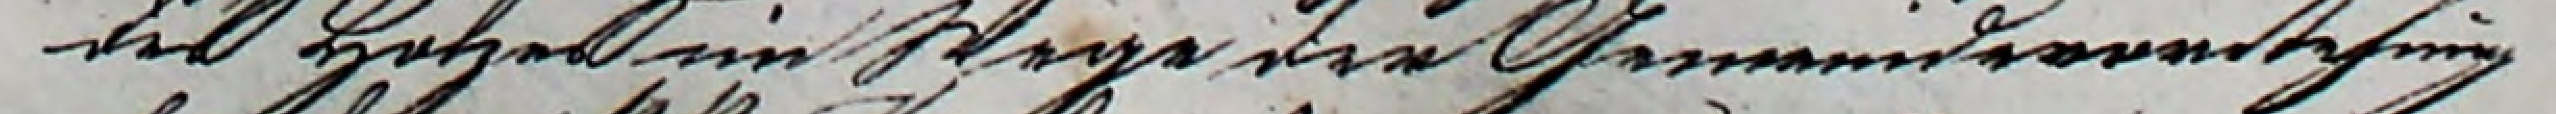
des Holzes im Wege der Gemeindevorsetzung
